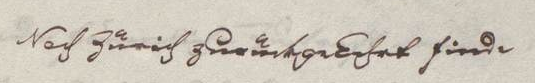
Nach Zürich zurückgekehrt finde
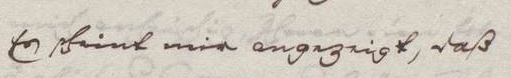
Es scheint mir angezeigt, daß
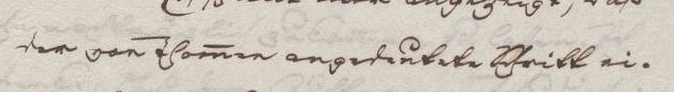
der von Thommen angedeutete Schritt ei-
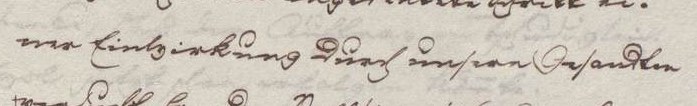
ner Einwirkung durch unsern Gesandten
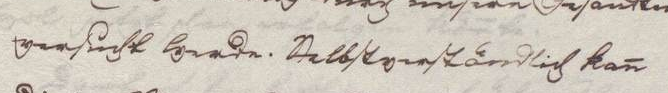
versucht werde. Selbstverständlich kann
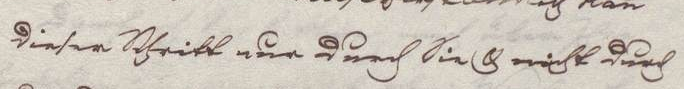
dieser Schritt nur durch Sie & nicht durch
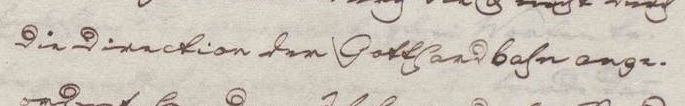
die Direction der Gotthardbahn ange-
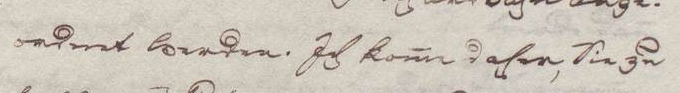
ordnet werden. Ich komme daher, Sie zu
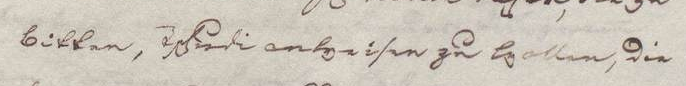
bitten, Tschudi anweisen zu wollen, die
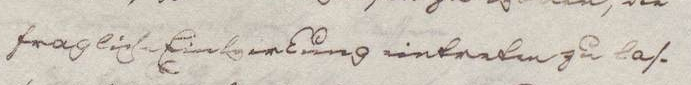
fragliche Einwirkung eintreten zu las-
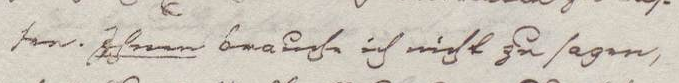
sen. Ihnen brauche ich nicht zu sagen,
